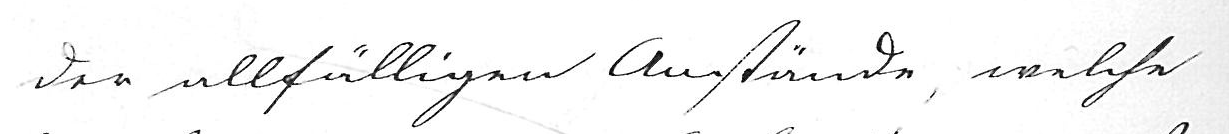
der allfälligen Anstände, welche
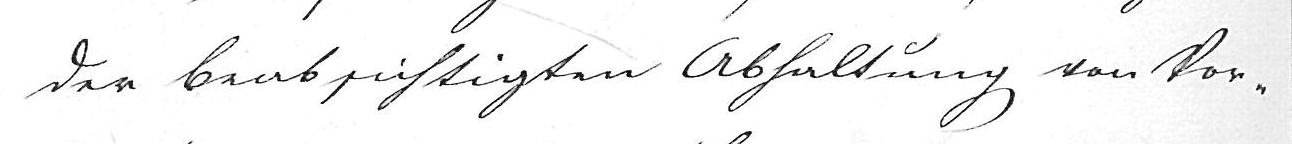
der beabsichtigten Abhaltung von Vor-
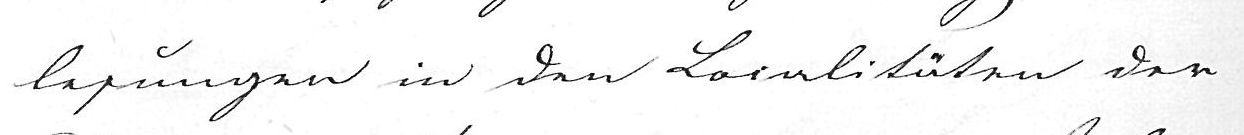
lesungen in den Localitäten der
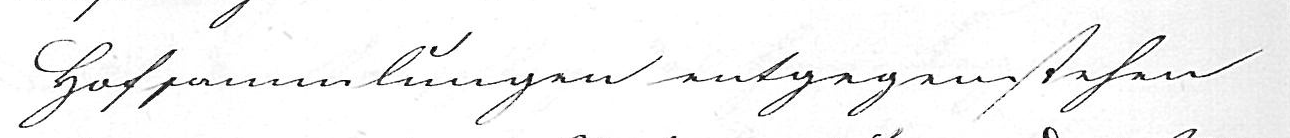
Hofsammlungen entgegenstehen
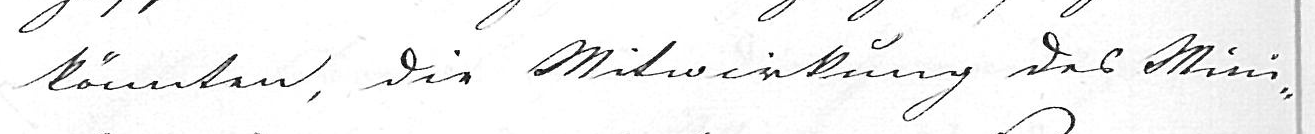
könnten, die Mitwirkung des Mini-
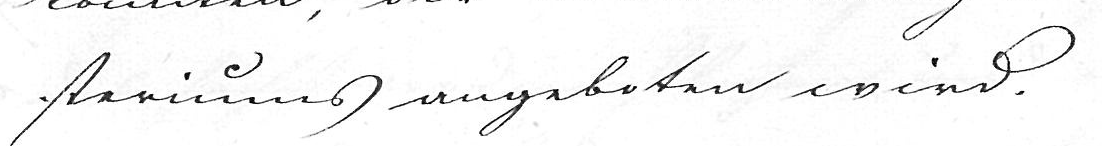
steriums angeboten wird.
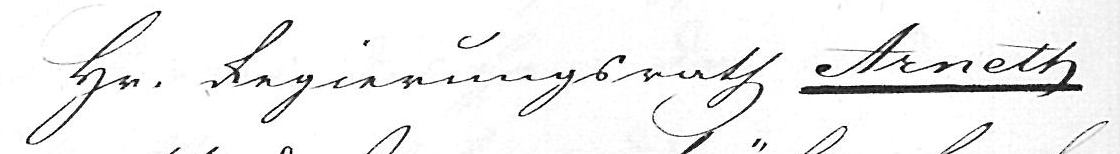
Hr. Regierungsrath Arneth
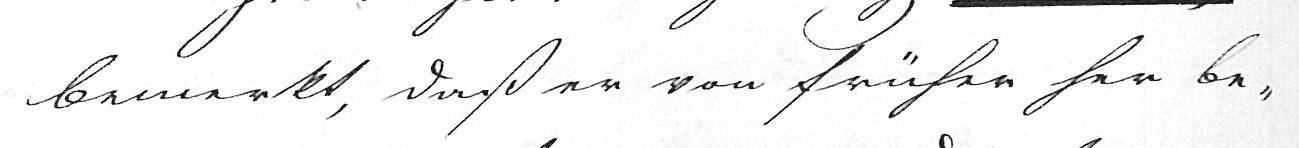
bemerkt, daß er von früher her be-
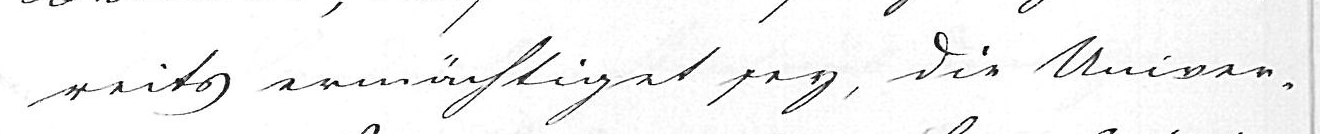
reits ermächtiget sey, die Univer-
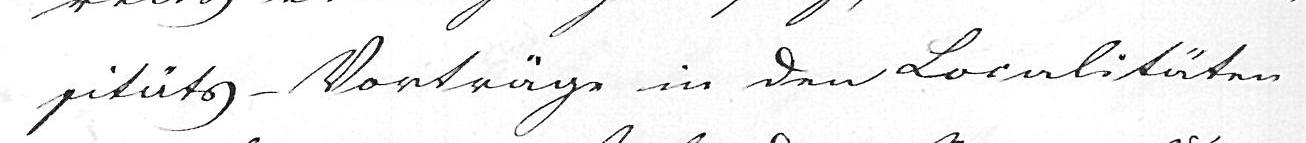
sitäts-Vorträge in den Localitäten
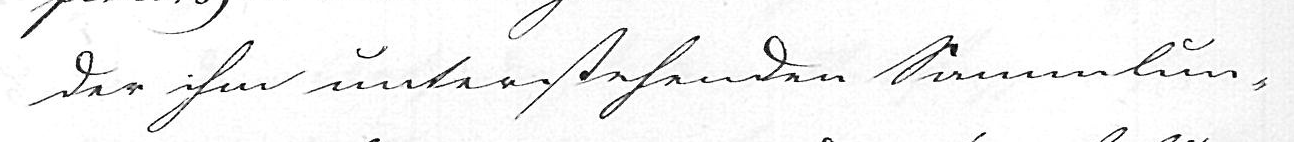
der ihm unterstehenden Sammlun-
